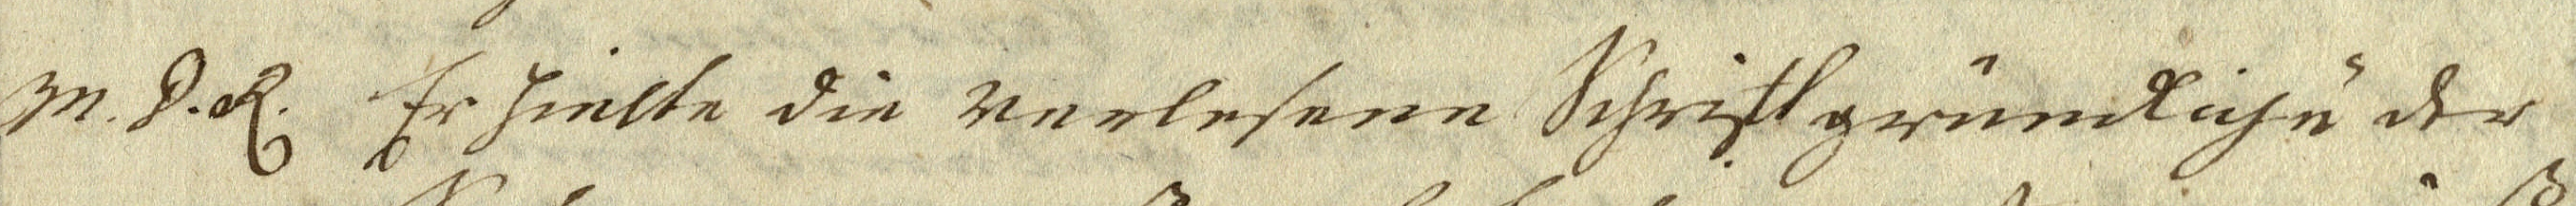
M. D. R. Er hielte die verlesene Schrift gründlich u der
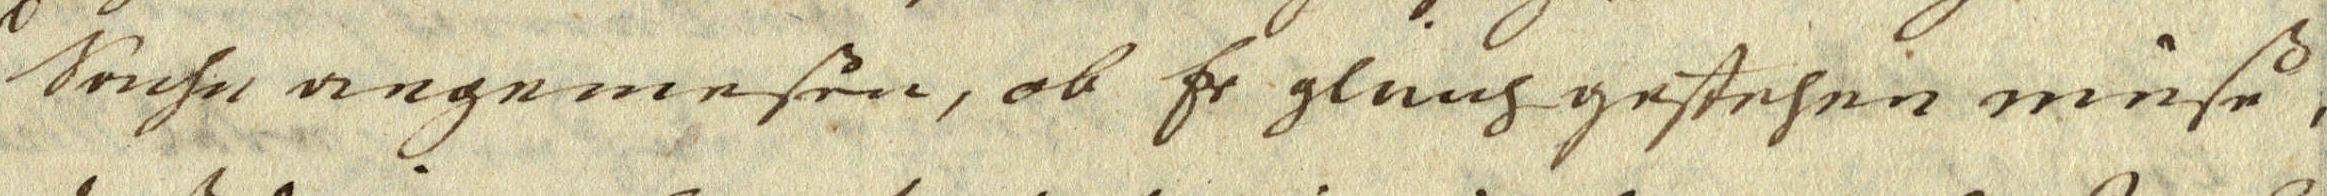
Sache angemeßen, ob Er gleich gestehen müße,
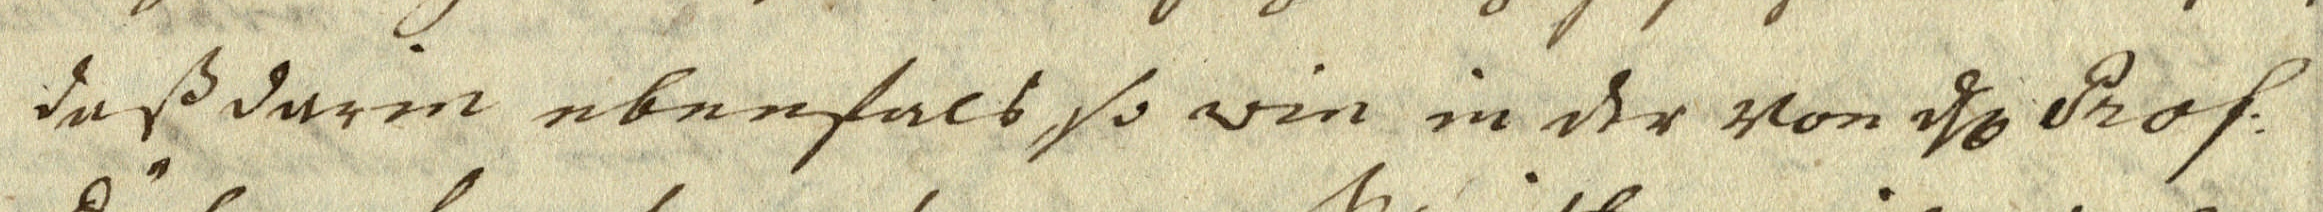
daß darin ebenfals, so wie in der von dh Prof.
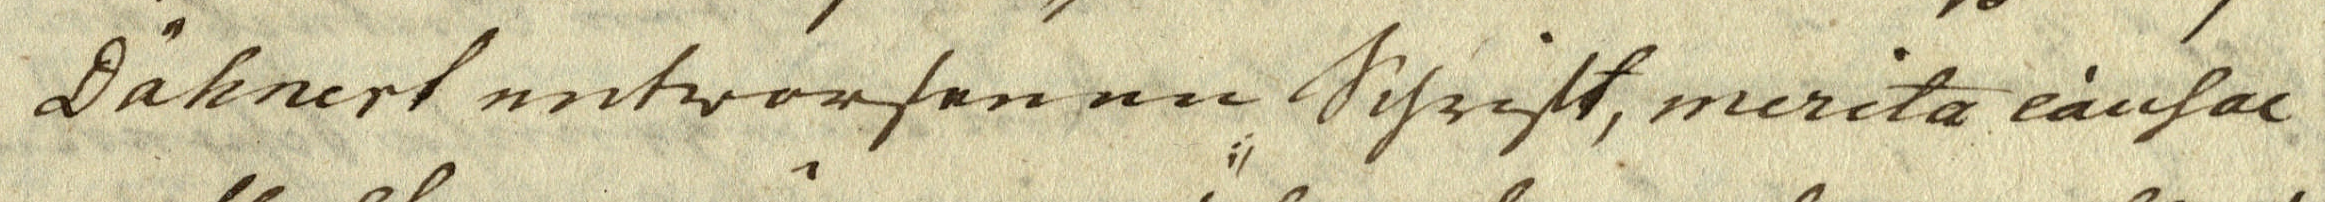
Dähnert entworfenen Schrift, merita causae
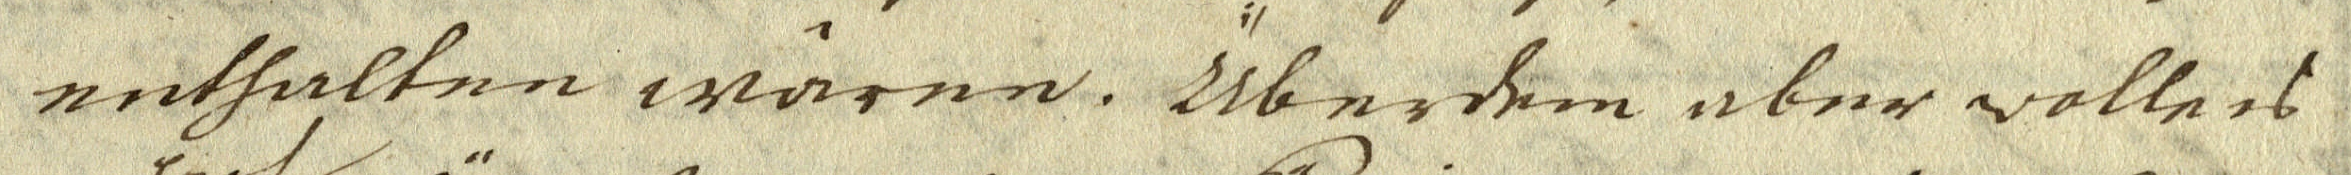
enthalten wären. Überdem aber wolle es
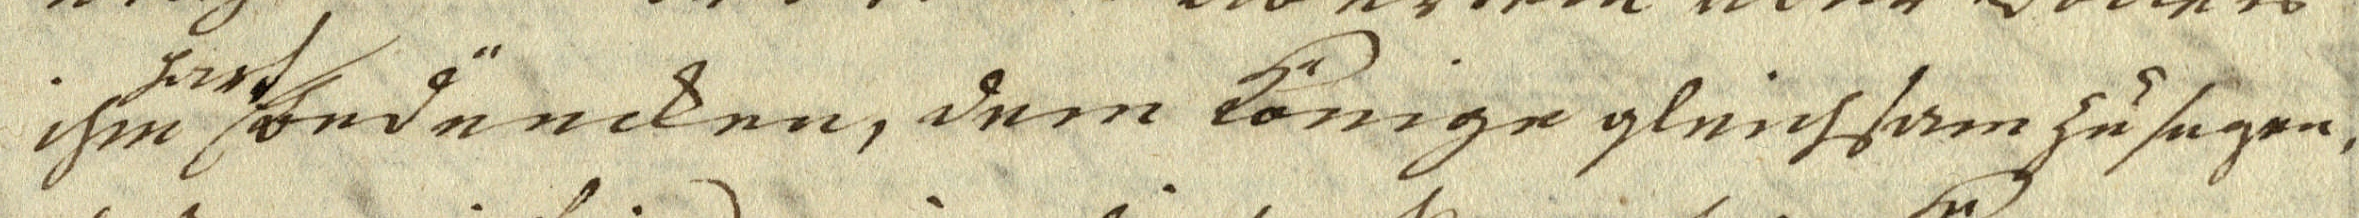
ihm hart bedüncken, dem Könige gleichsam zu sagen,
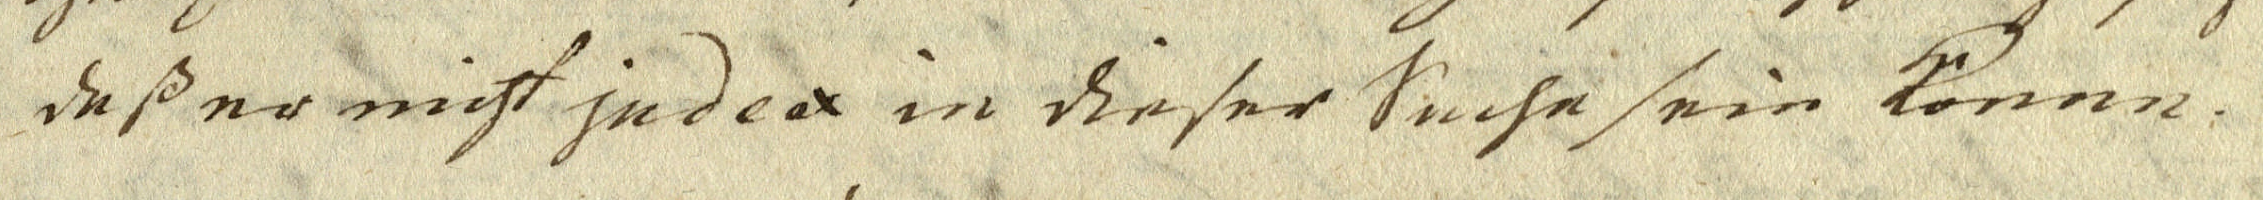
daß er nicht judece in die er Sache sein könne.
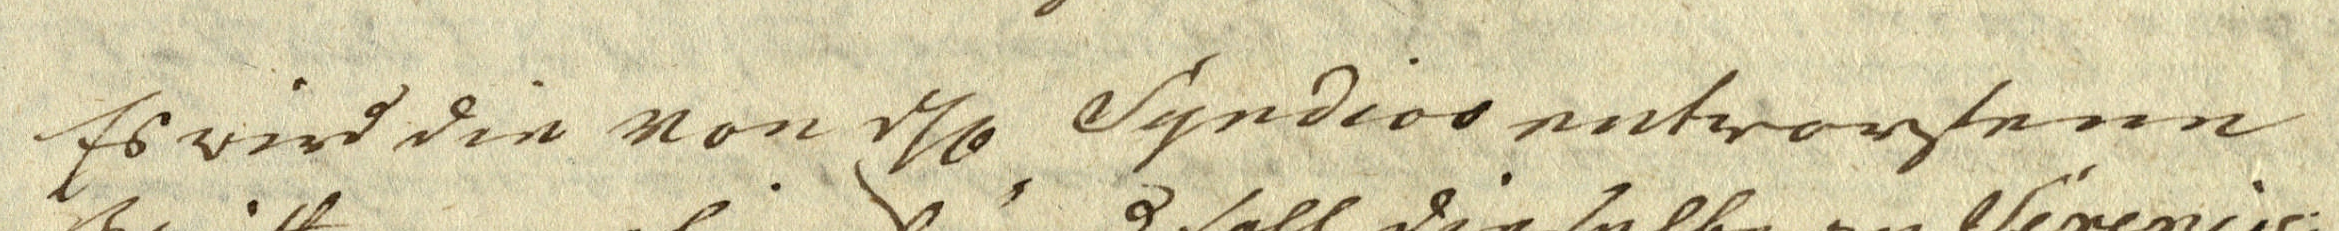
Es wird die von dh Syndico entworfene
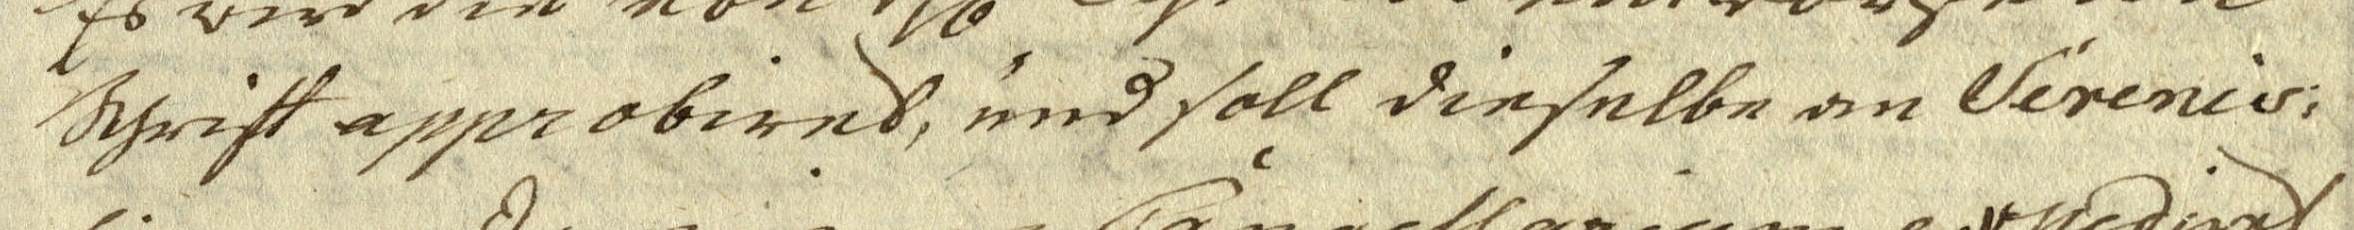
Schrift approbiret, und soll dieselbe an Serenis¬
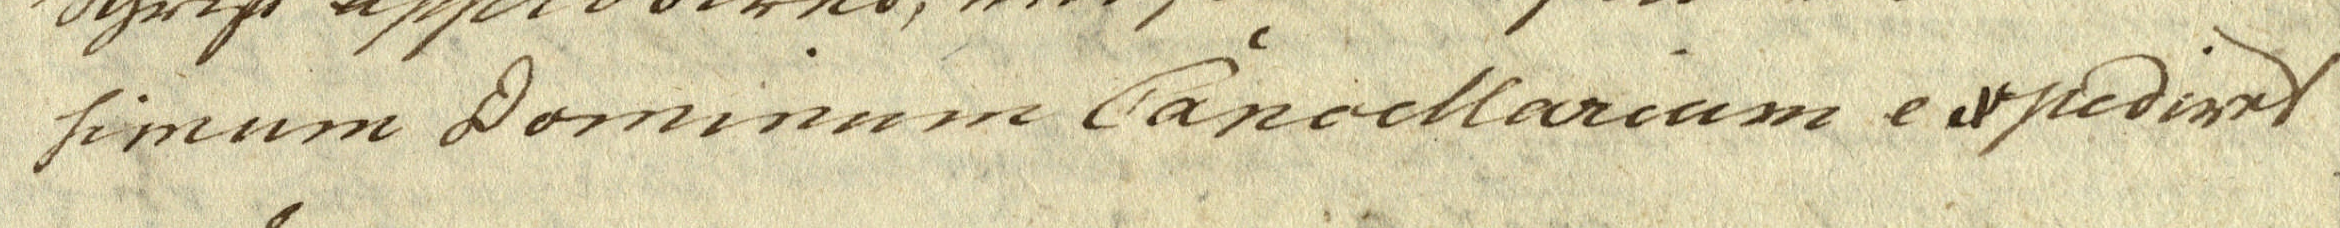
simum Dominum Cancellarium expediret
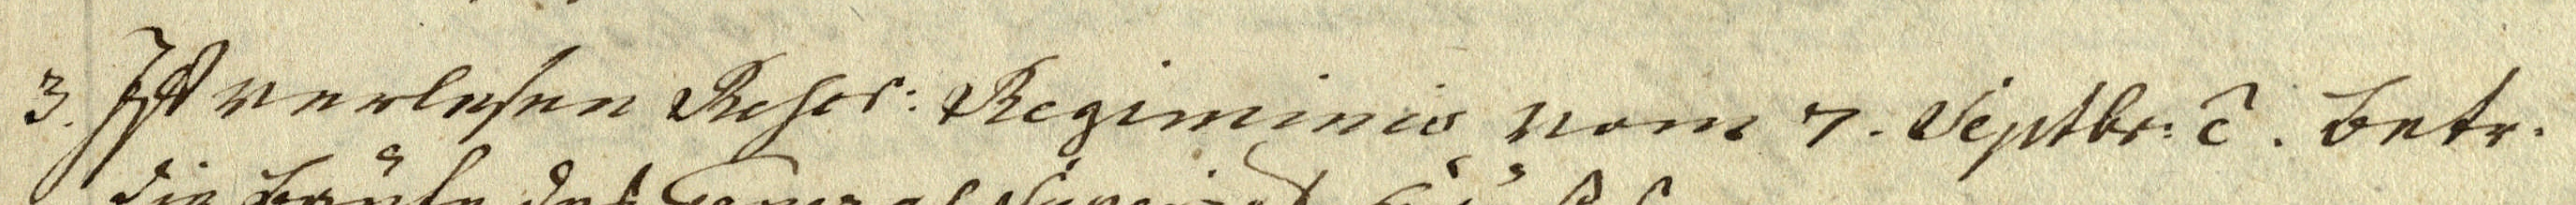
3. Ist verlesen Rescr. Regiminis vom 7. Septbr c. betr.
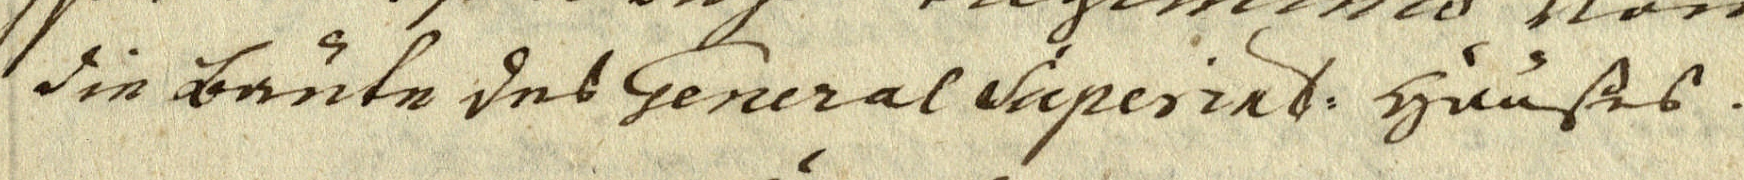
die Baute des General Superint. Haußes.
